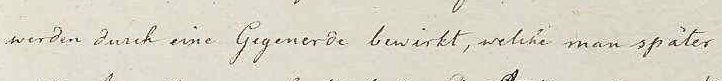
werden durch eine Gegenerde bewirkt, welche man später
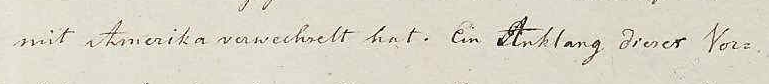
mit Amerika verwechselt hat. Ein EiAnklang dieser Vor-
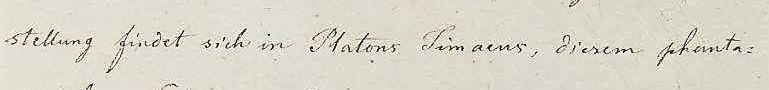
stellung findet sich in Platons Timaeus, diesem phanta-
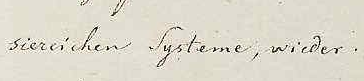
siereichen Systeme, wieder.
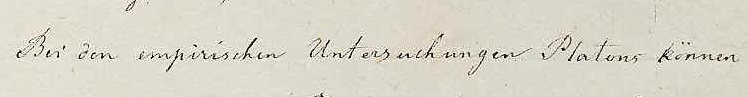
Bei den empirischen Untersuchungen Platons können
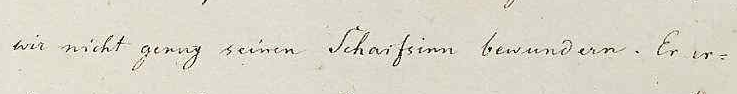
wir nicht genug seinen Scharfsinn bewundern. Er er-
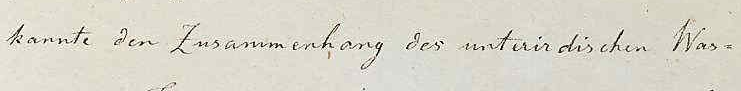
kannte den Zusammenhang des unterirdischen Was-
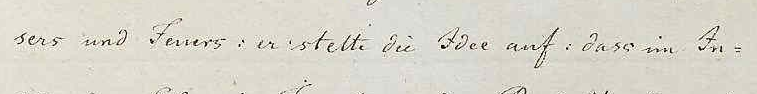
sers und Feuers: er stellte die Idee auf: dass im In-
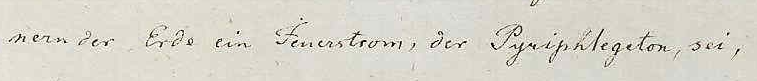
nern der Erde ein Feuerstrom, der Pyriphlegeton, sei,
